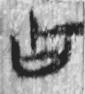占
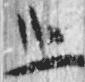之
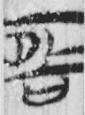恆
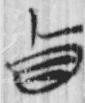貞
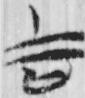吉
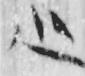少
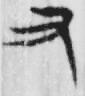又（有）
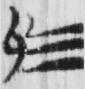於
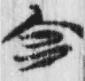宮
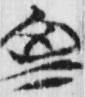室
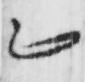㠯
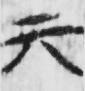亓
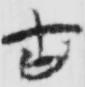古
